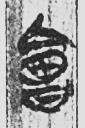會
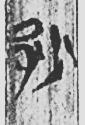{少阝}
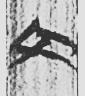文
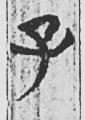子
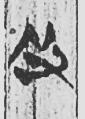及
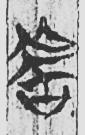者
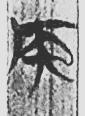侯
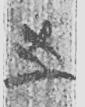之
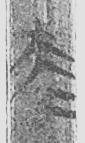夫=
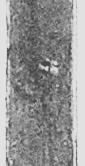明
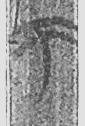于
